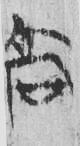高
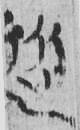從
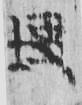埤
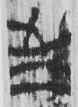至
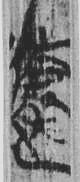遠
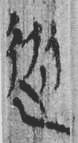從
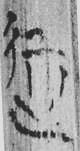迩（邇）
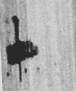十
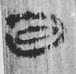回（圍）
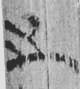之
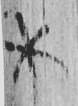木
